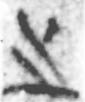之
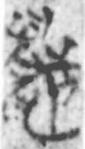○（豻）
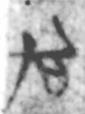加（勒）
